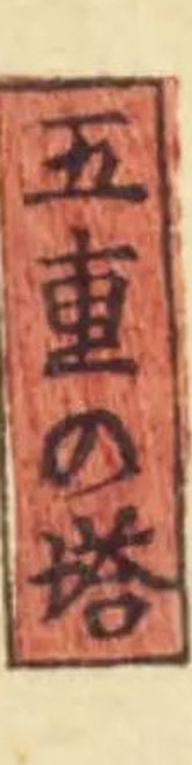五重の塔
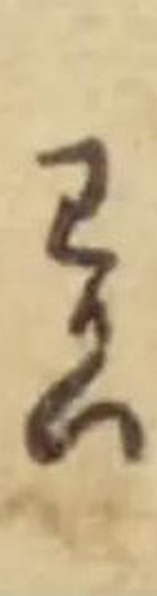わりい
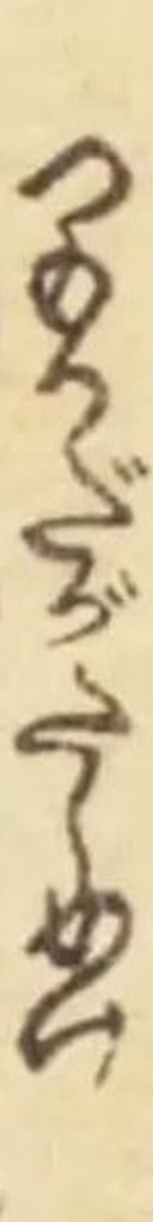つもりだがたゝめい
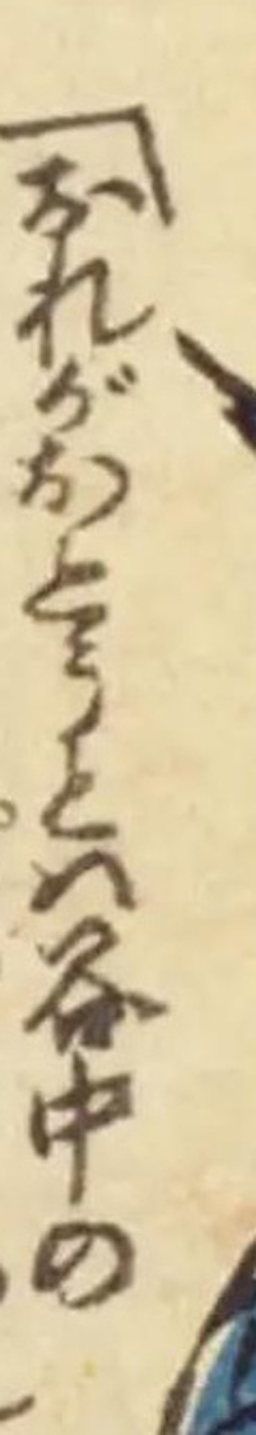「おれがおとうとは谷中の
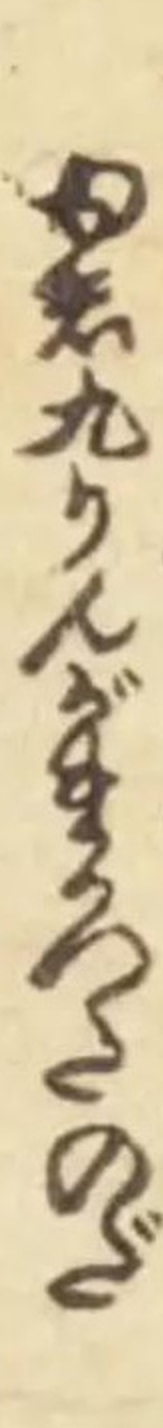ゆゑ九りんがまかつたのだ
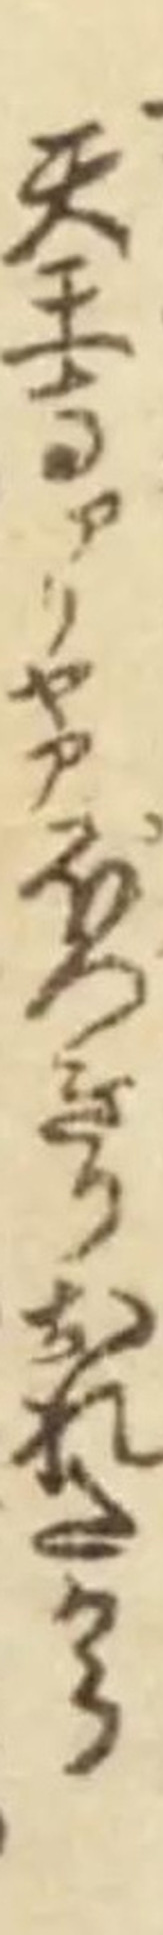天王寺アリヤアすつきりおれたから
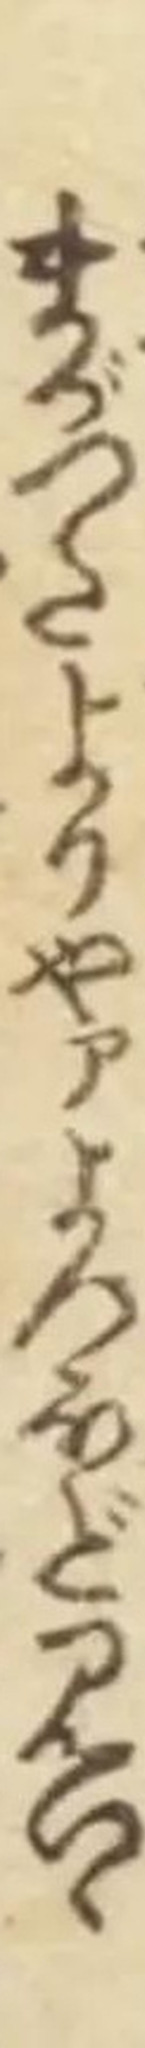まがつたよりやアよつほど見て
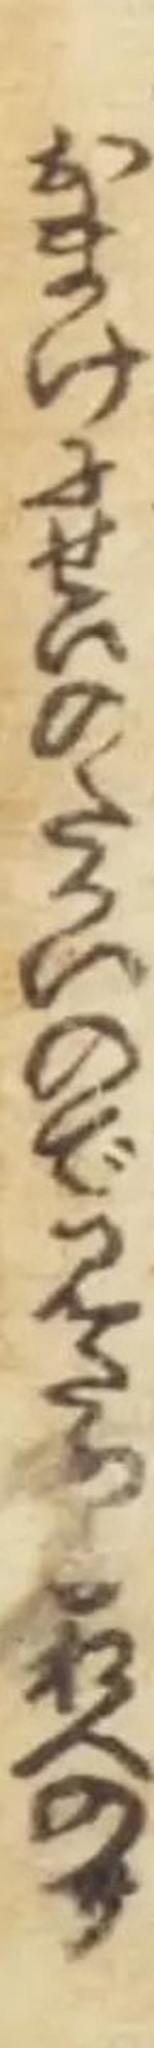おまけにせいのたかいので見たらねへのサ
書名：安政二年十月二日地震出火後日角力
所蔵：国立国会図書館 National Diet Library, JAPAN
